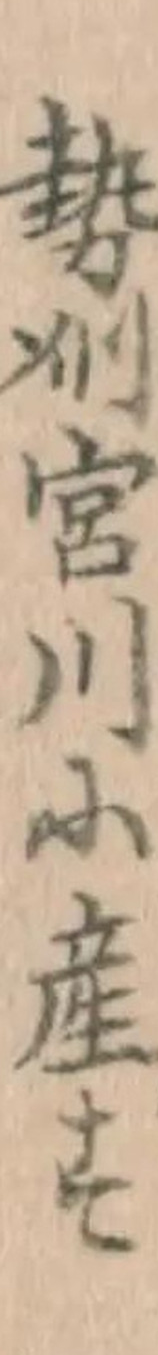勢州宮川に産す
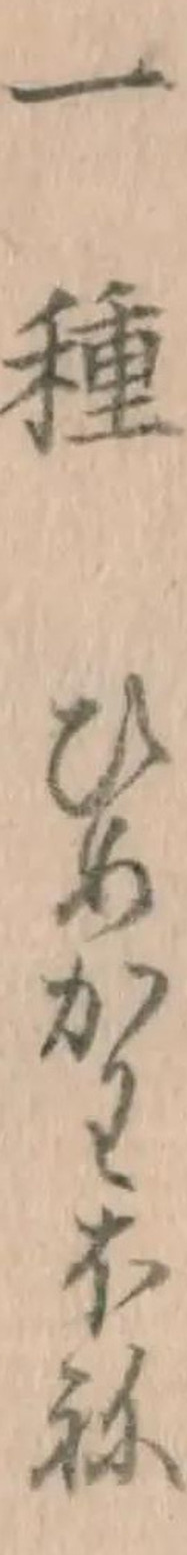一種ひめかわほね
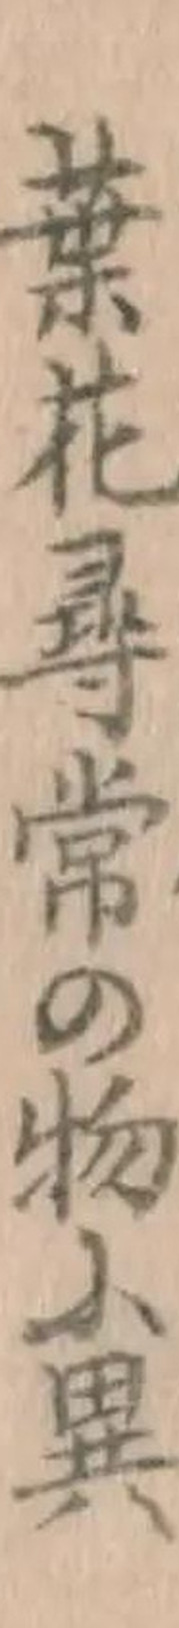葉花尋常の物に異
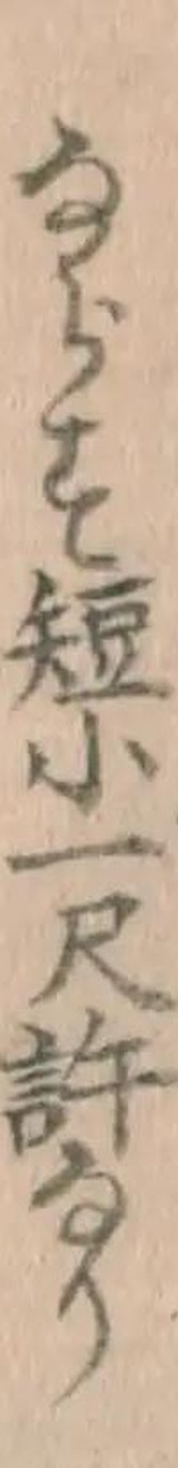ならす短小一尺許なり
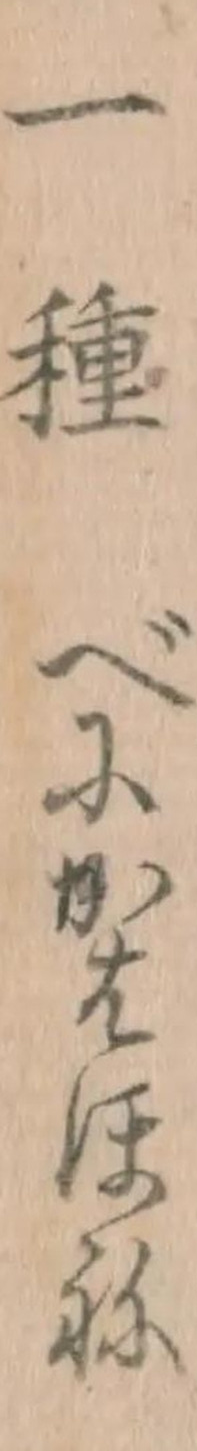一種べにかはほね
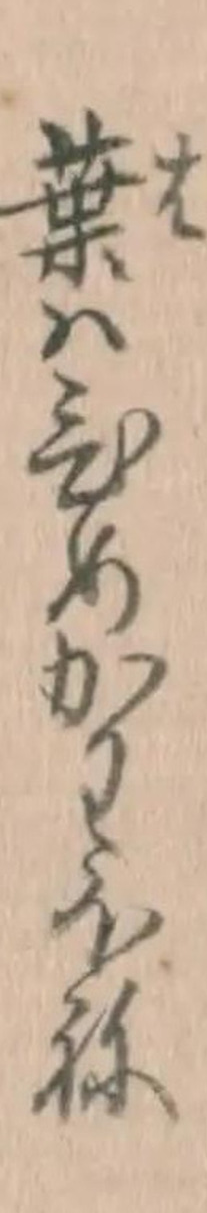葉はひめかわほね
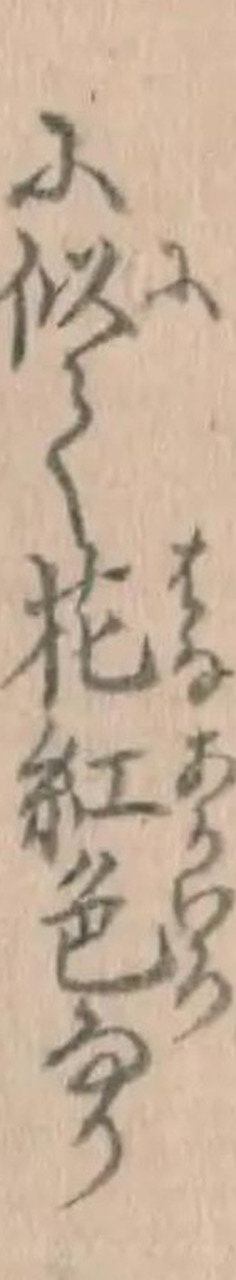に似て花紅色なり

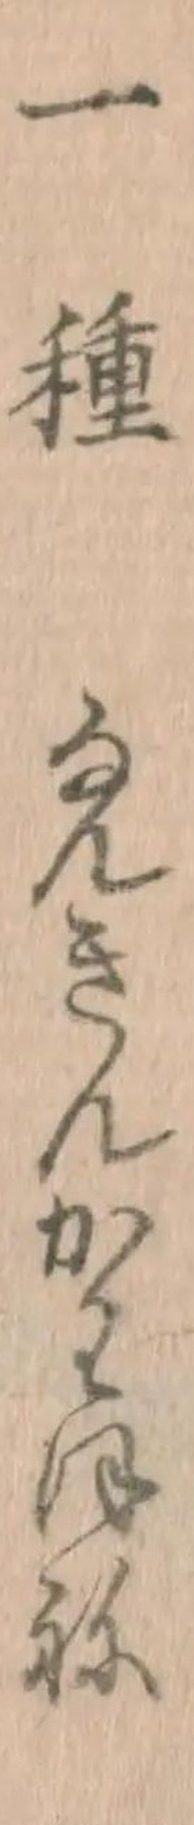一種なんきんかわほね
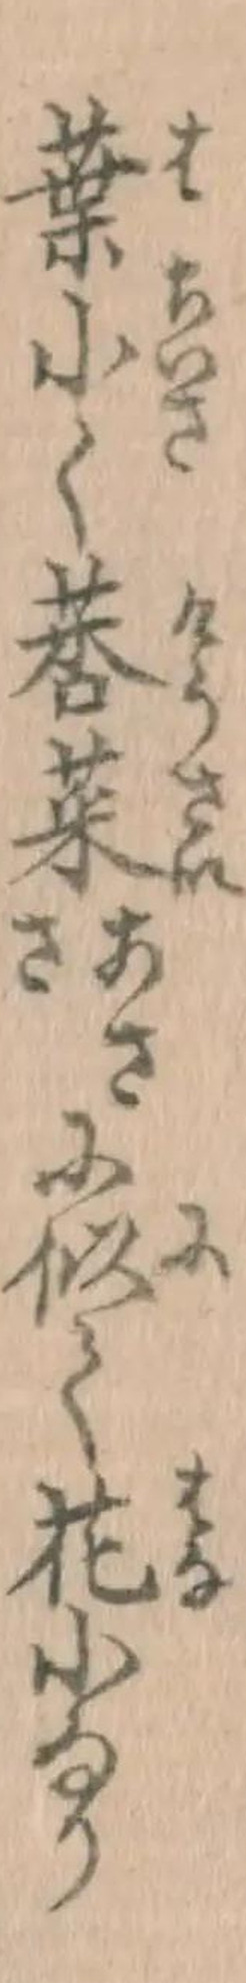葉小く莕菜あささに似て花小なり
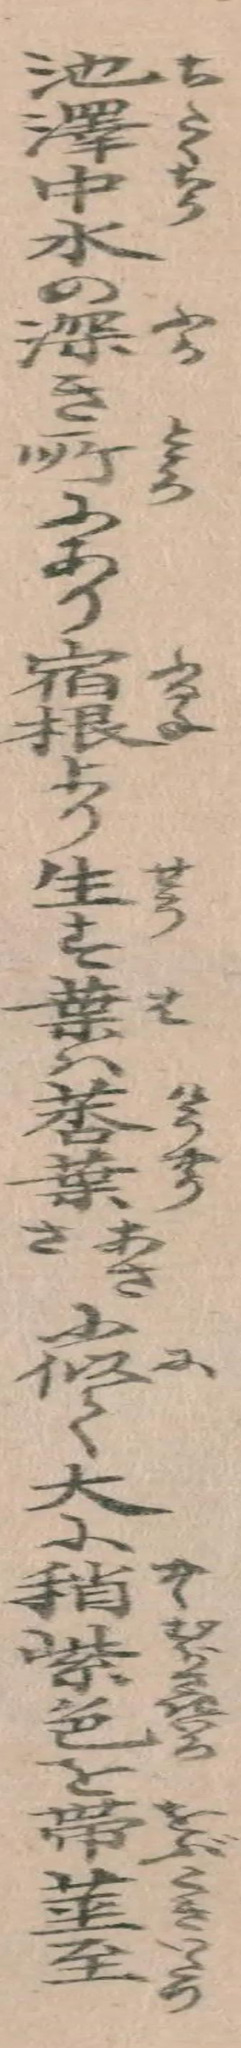池沢中水の深き所にあり宿根より生す葉は莕葉あささに似て大に稍紫色を帯茎至
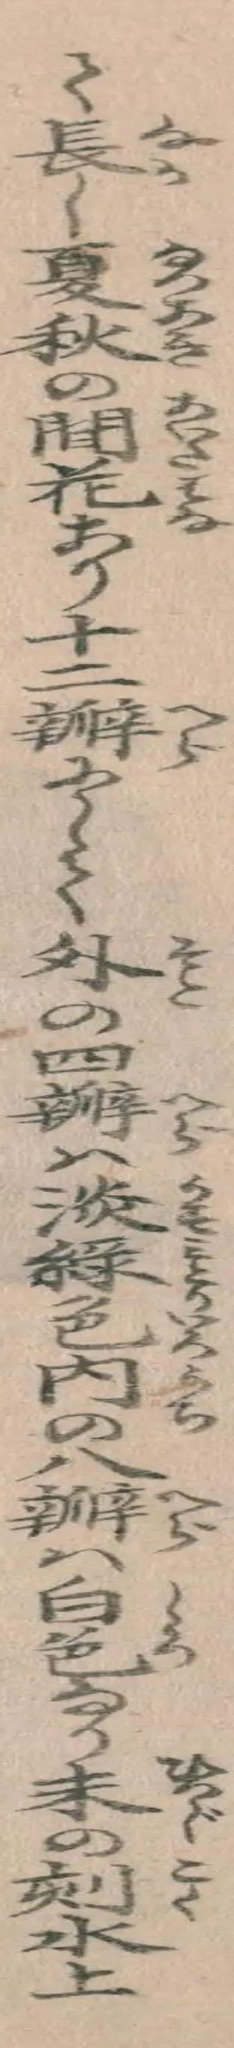て長し夏秋の間花あり十二弁にして外の四弁は淡緑色内の八弁は白色なり未の刻水上
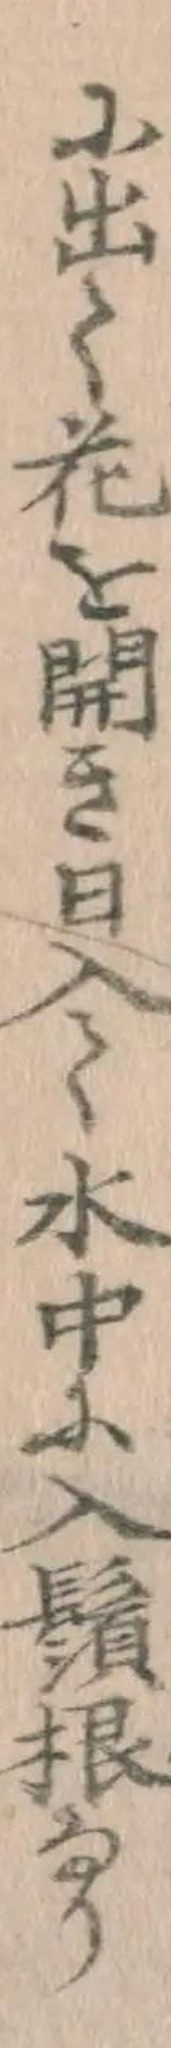に出て花を開き日入て水中に入鬚根なり
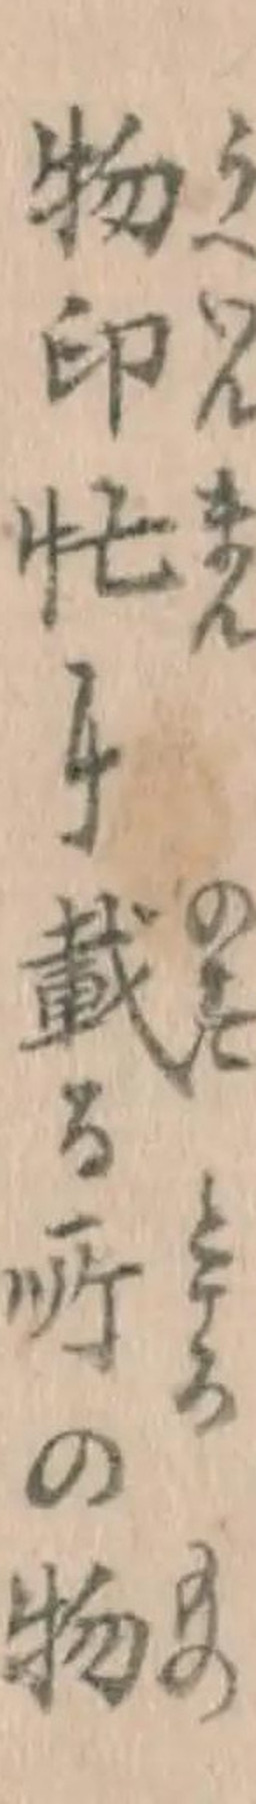物印忙に載る所の物

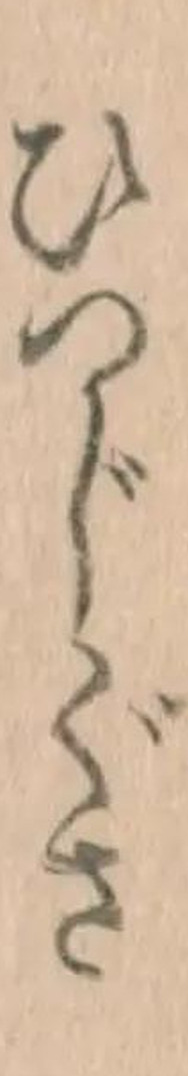ひつじぐさ

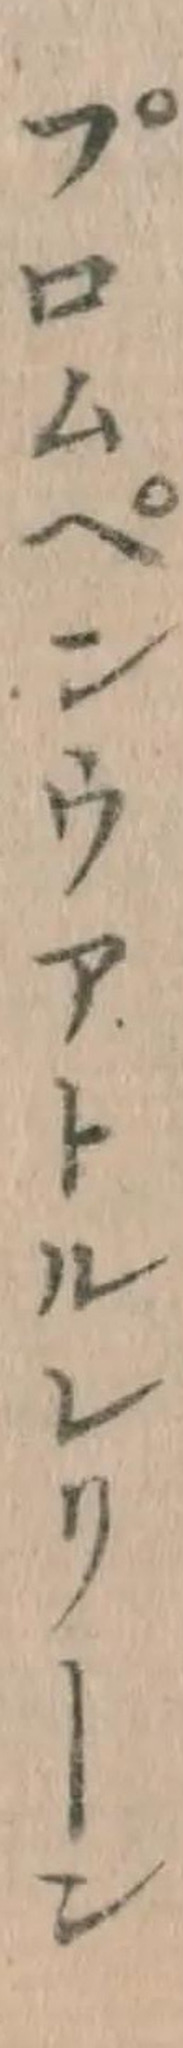プロムペンウアトルレリーン
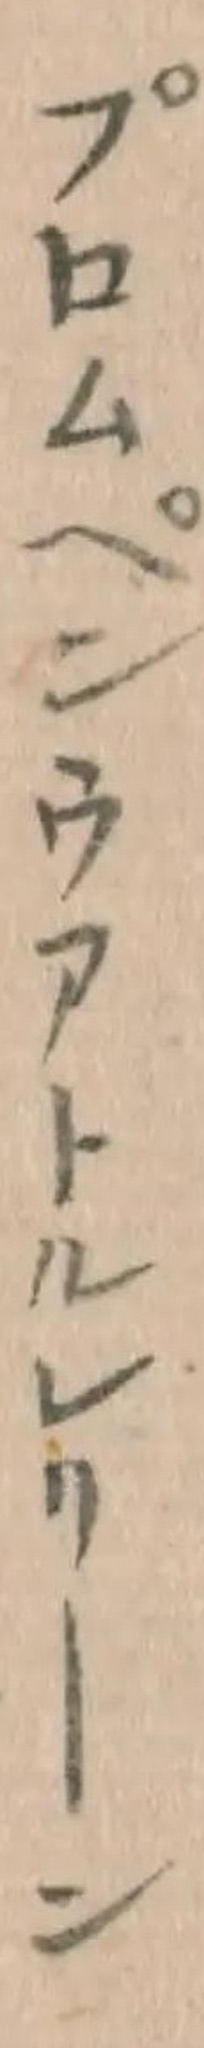プロムペンウアトルレリーン
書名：本草図譜. 巻34-36
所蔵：国立国会図書館 National Diet Library, JAPAN
